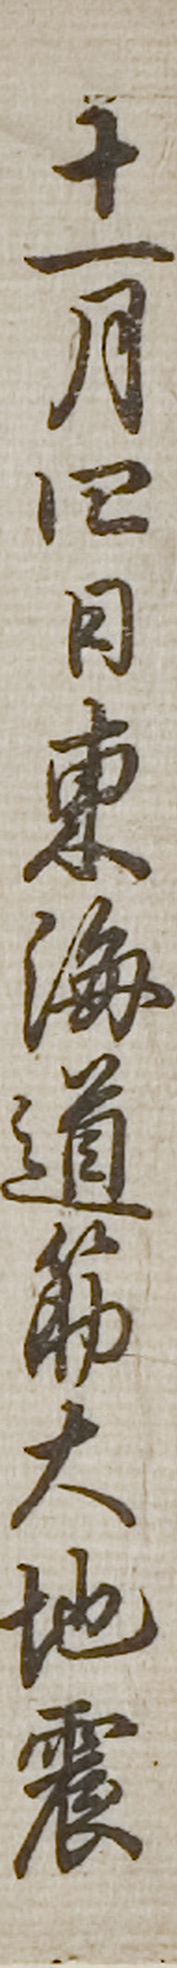十一月四日東海道筋大地震
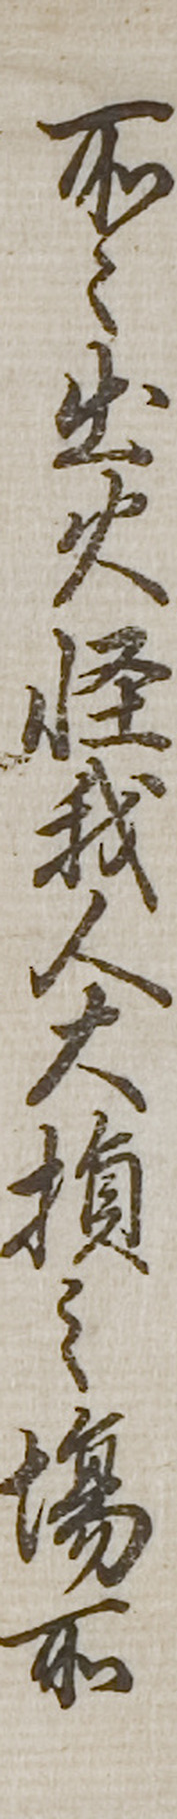所〻出火怪我人大損之場所
